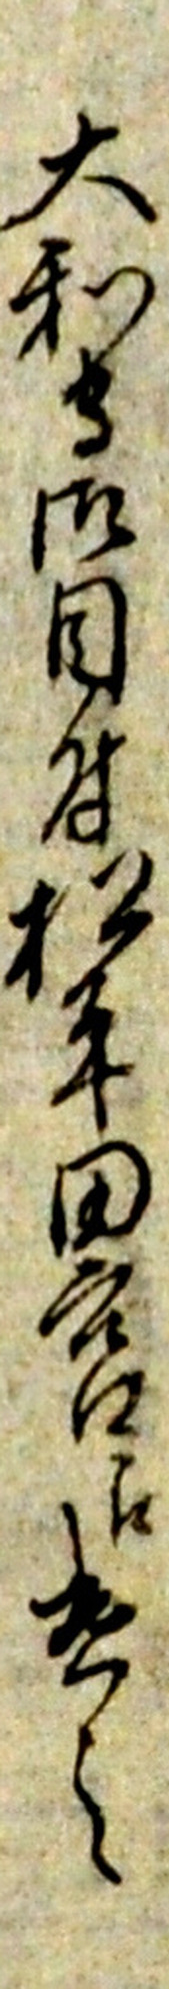大和守御目付松平田宮江遣之
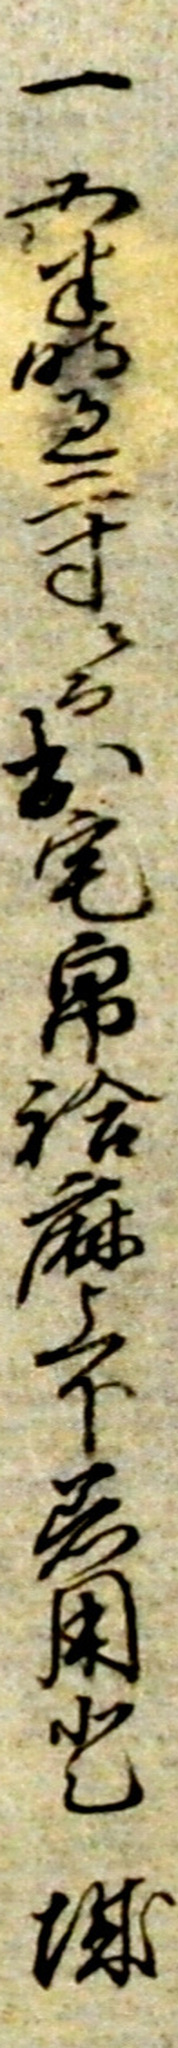一五半時過二寸二而出宅帛袷麻着用登城
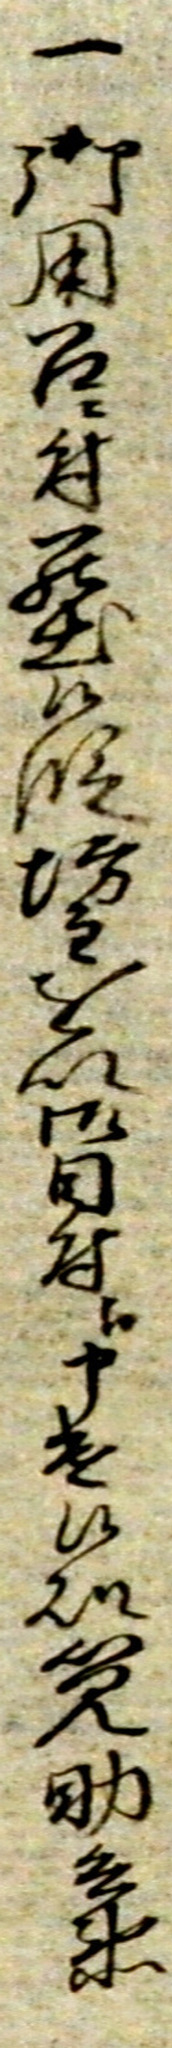一御用召二付罷出候段坊主を以御目付江申遣候処兌助兵衛
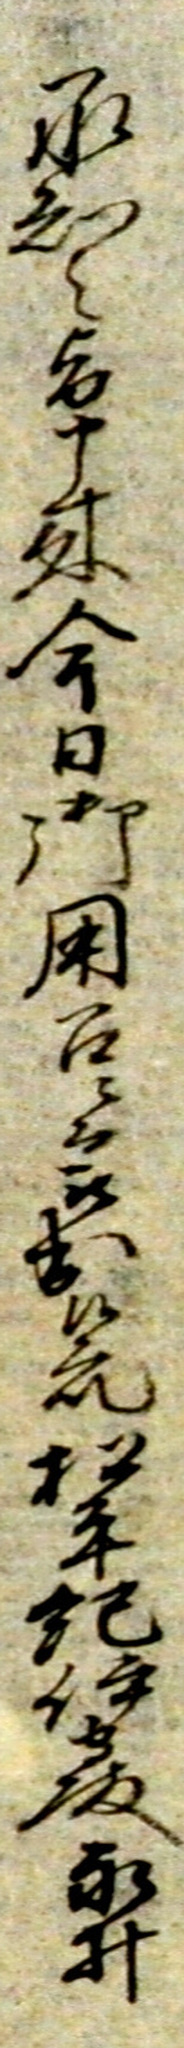承知之旨申来今日御用召二而被出候衆松平紀伊守殿永井
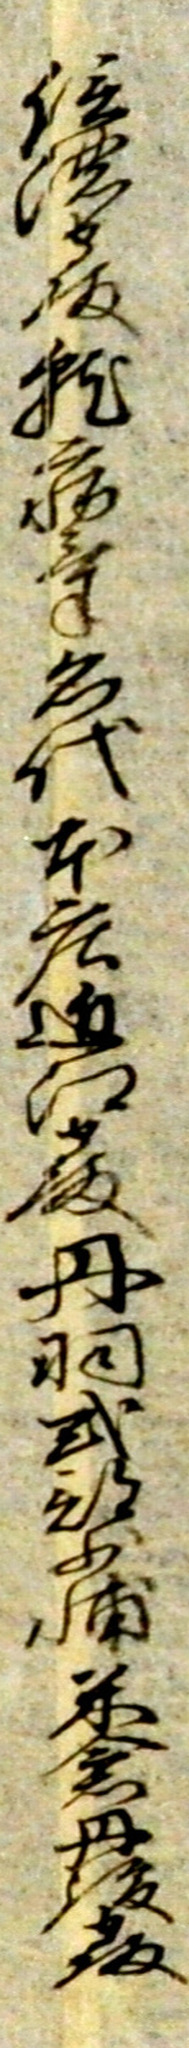信濃就病気名代本庄近江守殿丹羽式部少輔米倉丹波守殿
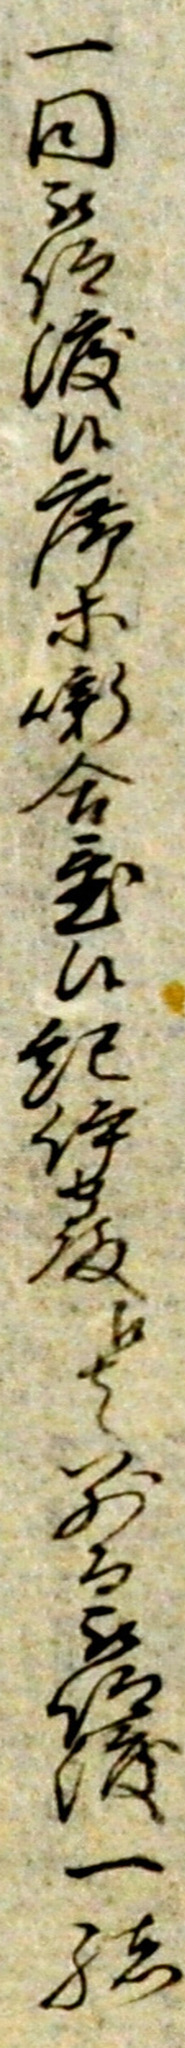一同被仰渡候席抔含め合置紀伊守殿江者別而被仰渡一統
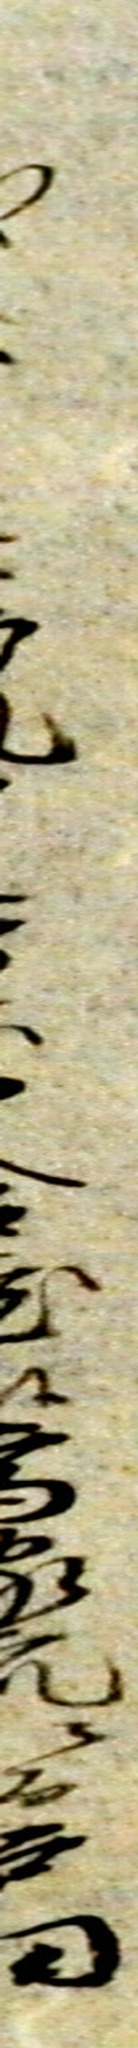之儀出方幷御礼申上方抔申合置候高家衆二而戸田

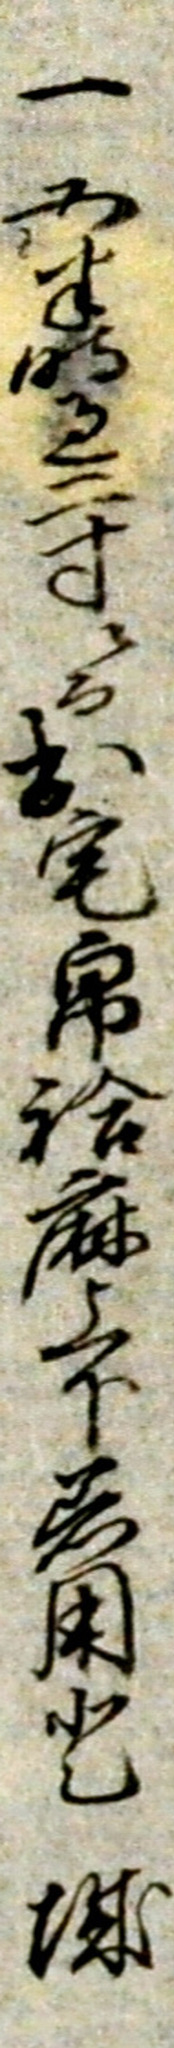一五半時過二寸二而出宅帛袷麻上下着用登城
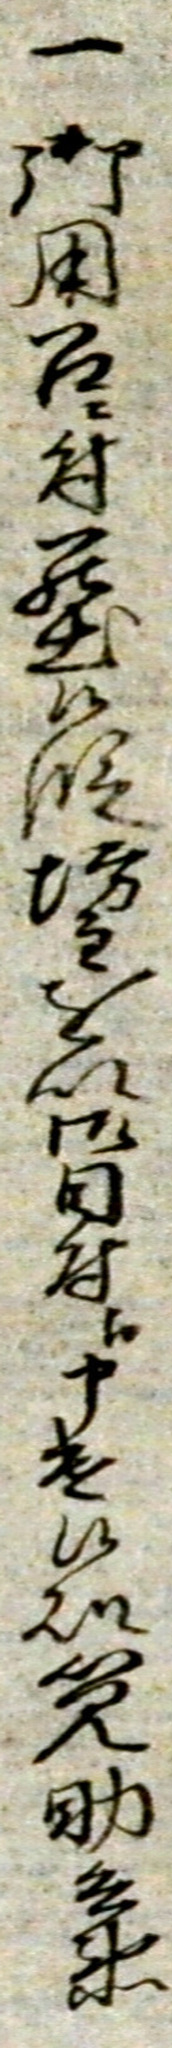一御用召二付罷出候段坊主以御目付江申遣候処兌助兵衛
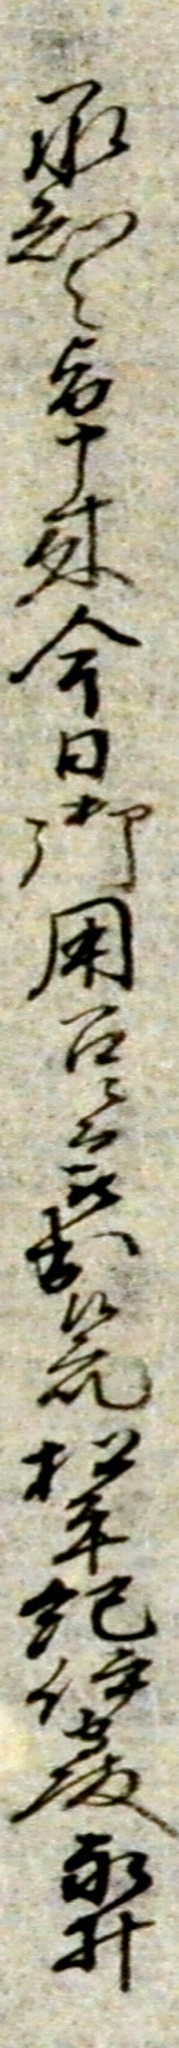承知之旨申来今日御用召二而被出候衆松平紀伊守殿永井
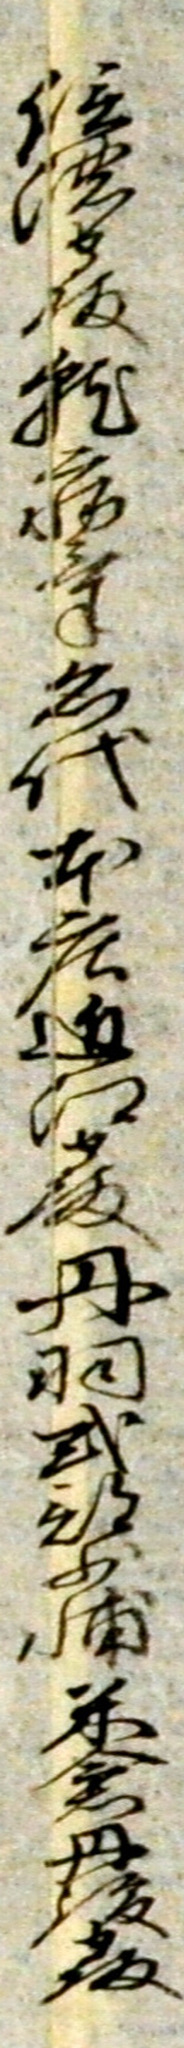信濃守殿就病気名代本庄近江守殿丹羽式部少輔米倉丹後
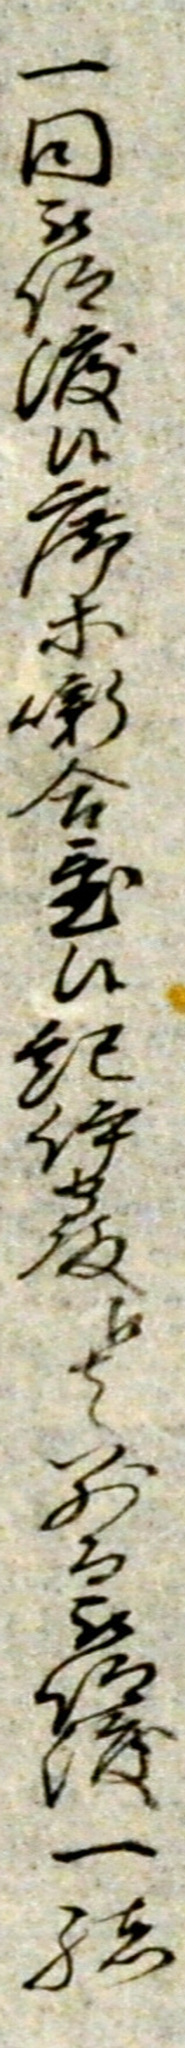一同被仰渡候席抔噺合置候紀伊守殿江者別而被仰渡一統
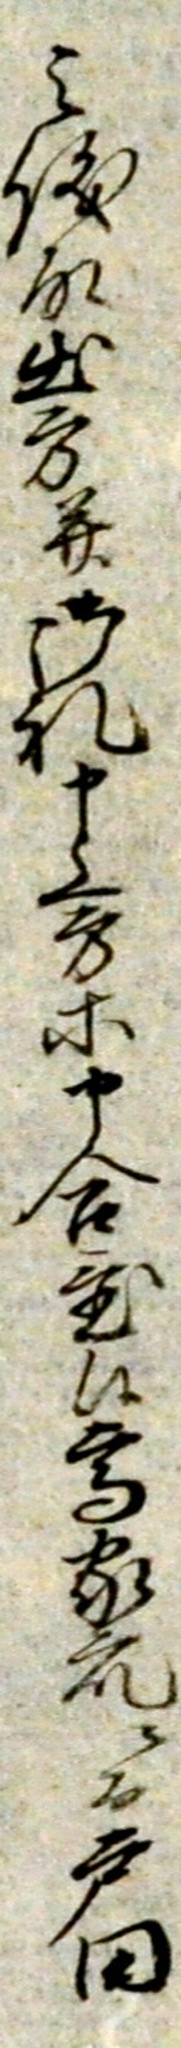之儀承出方幷御礼申上方抔申合置候高家衆二而戸田
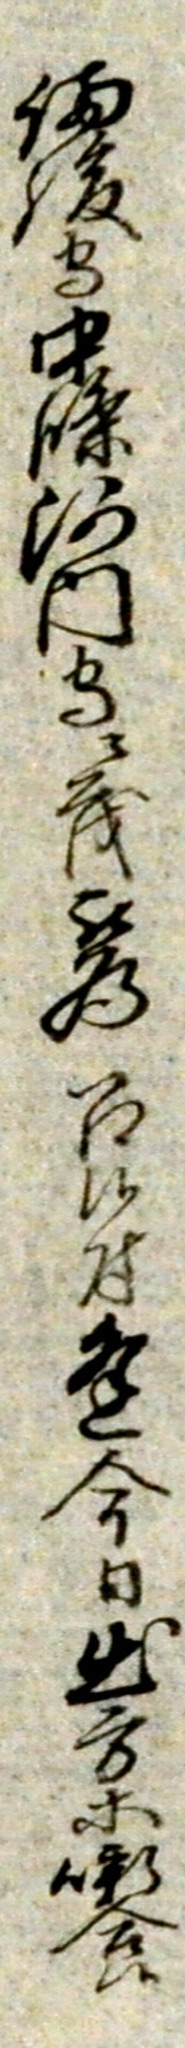備後守中條河内守二茂被為召候付逢今日出方抔噺合候
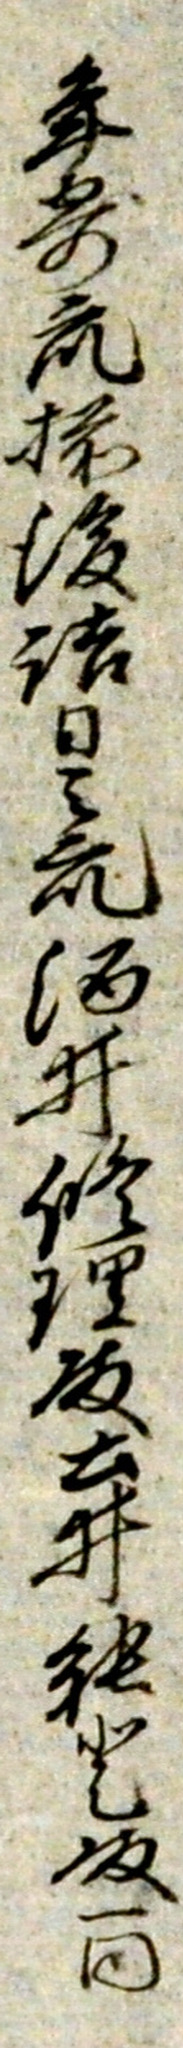年寄衆揃後詰日之衆酒井修理殿土井能登殿一同
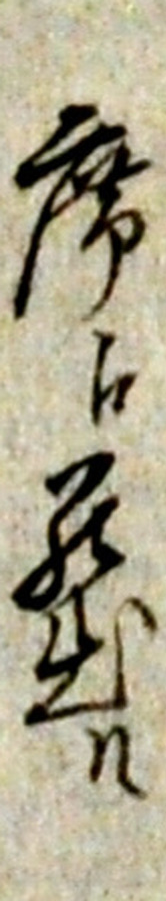席江罷出ㇽ
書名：日光御名代相勤候節ノ留
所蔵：伊那市立高遠町図書館・合同会社AMANE
